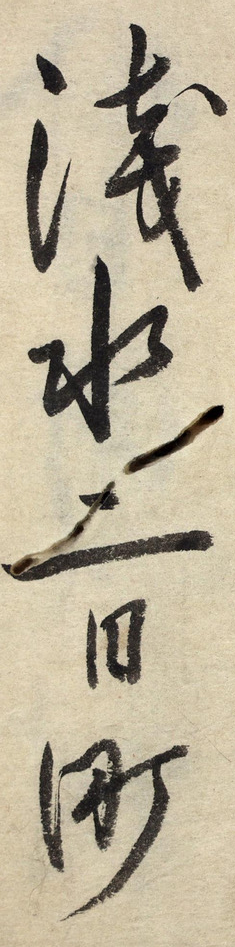浅水二日町

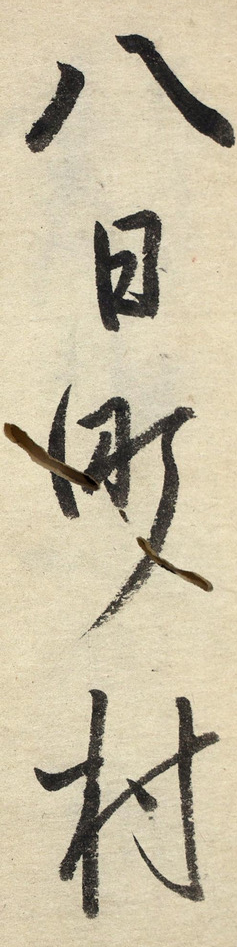八日町村
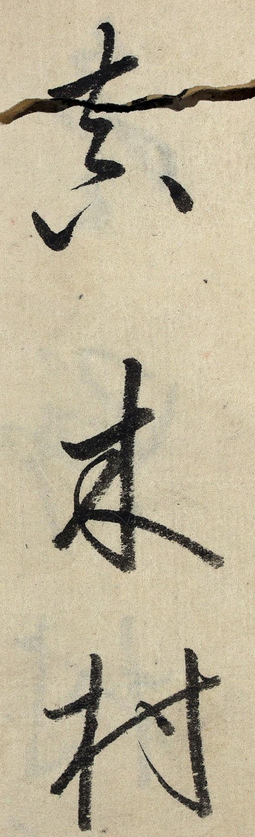真木村
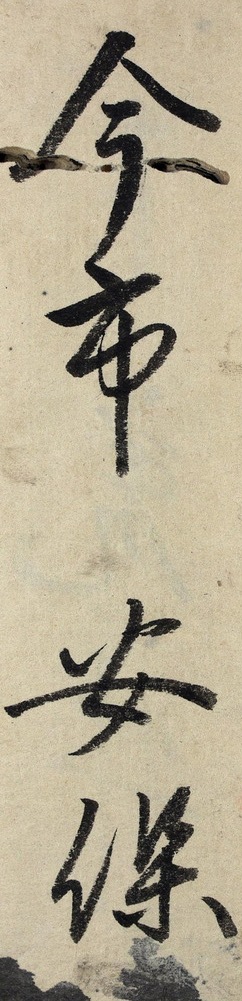今市安保
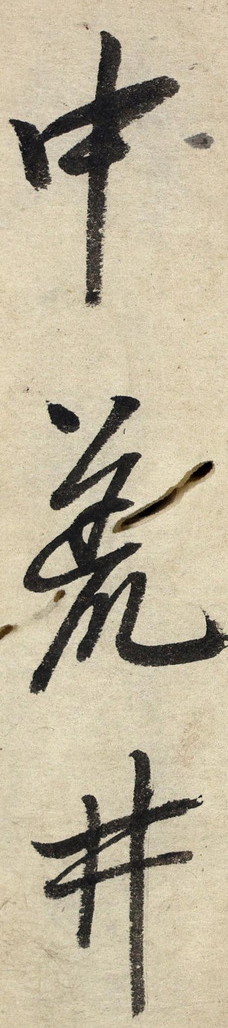中荒井

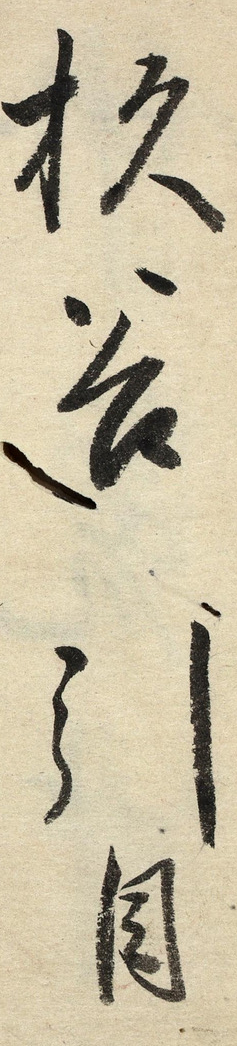杉谷引目
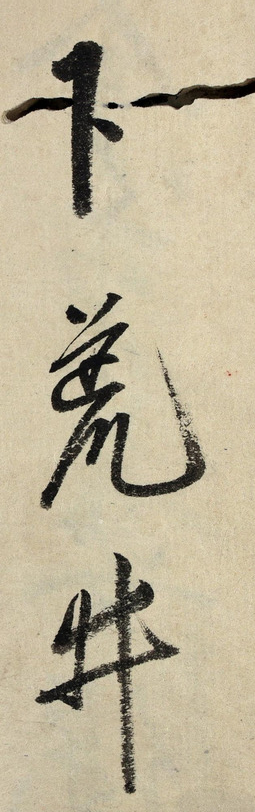下荒井
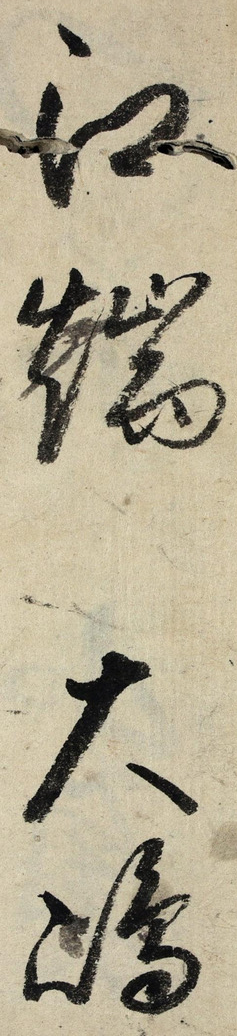江端大嶋
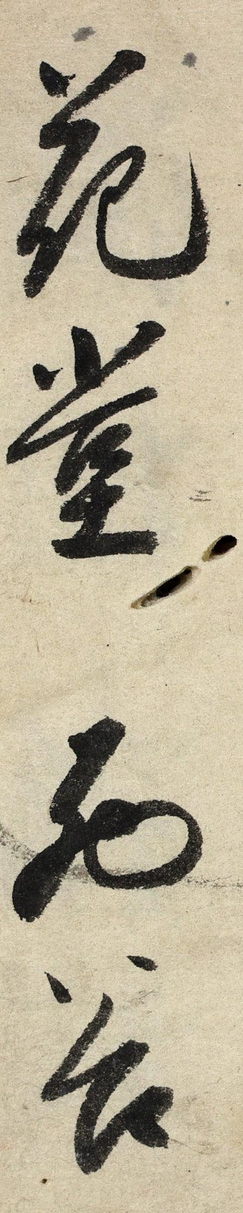花堂西谷

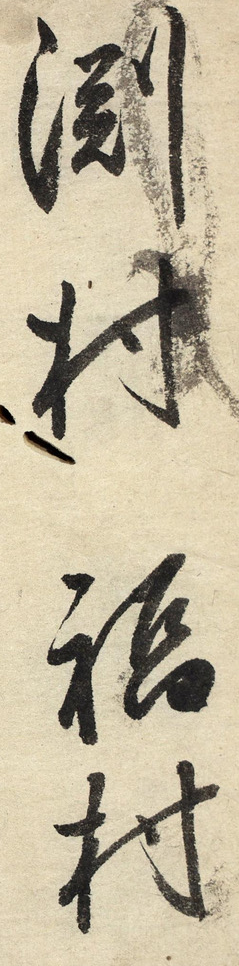渕村福村
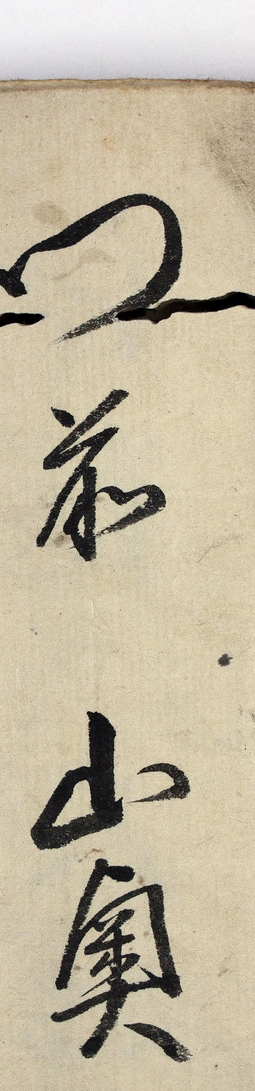門前山奥
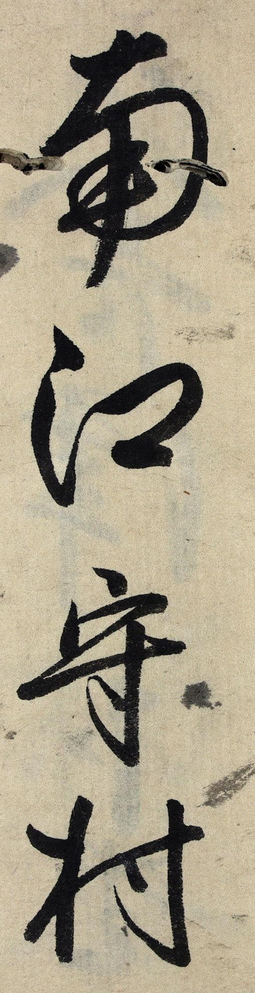南江守村
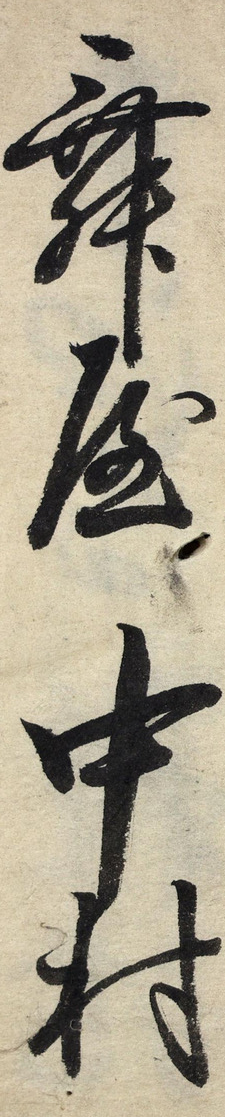舞屋中村

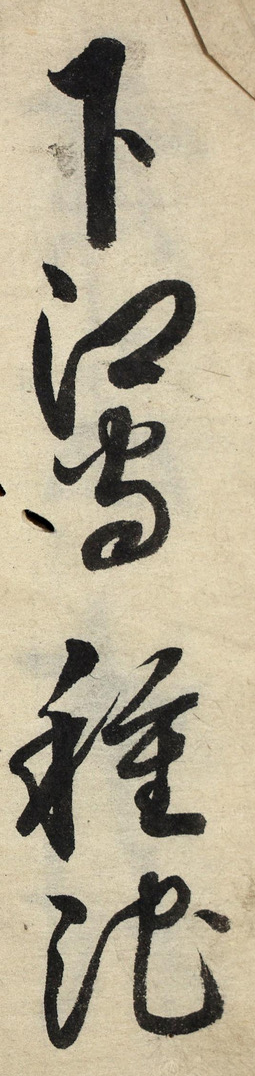下江守種池
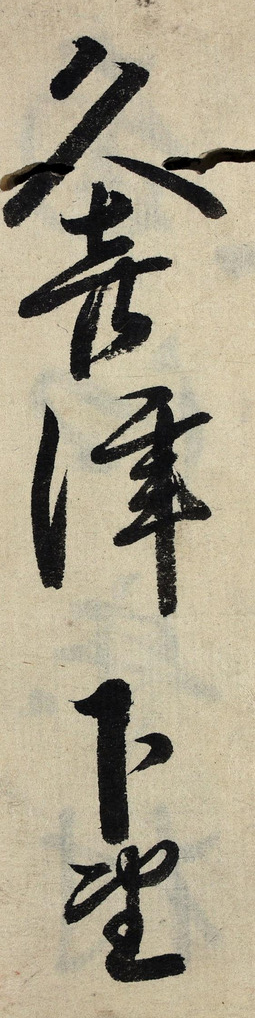久喜津下野
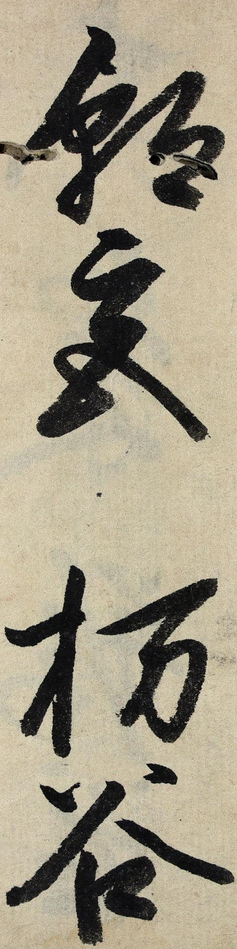朝宮栃谷
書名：村尽（合谷・南居・三尾野等村々、敦賀県・足羽県等、受取等例文…
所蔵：福井県文書館 Fukui Prefectural Archives
